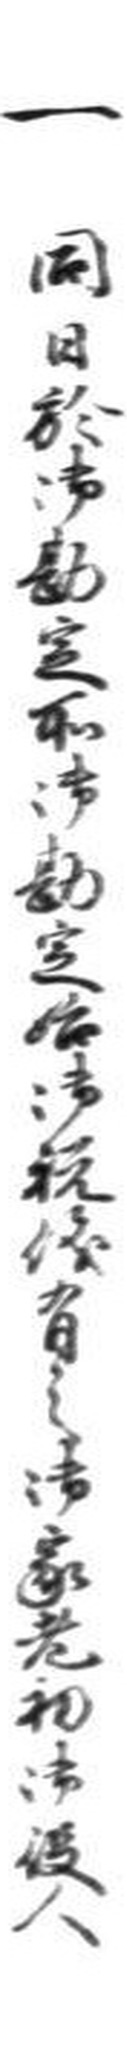一同日於御勘定所御勘定始御祝儀有之御家老初御役人
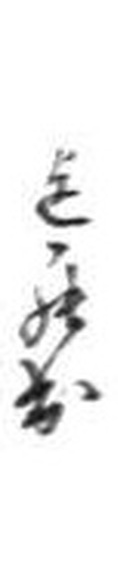迄罷出

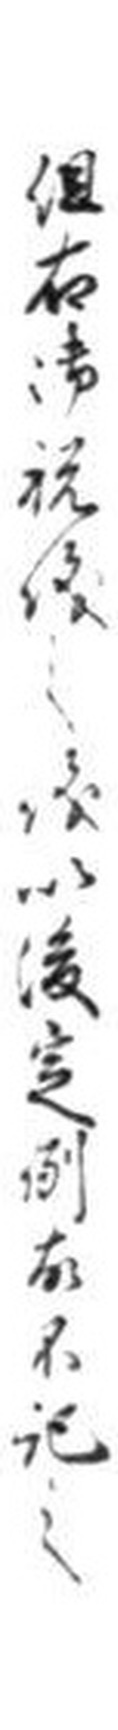但右御祝儀之儀以後定例故不記之
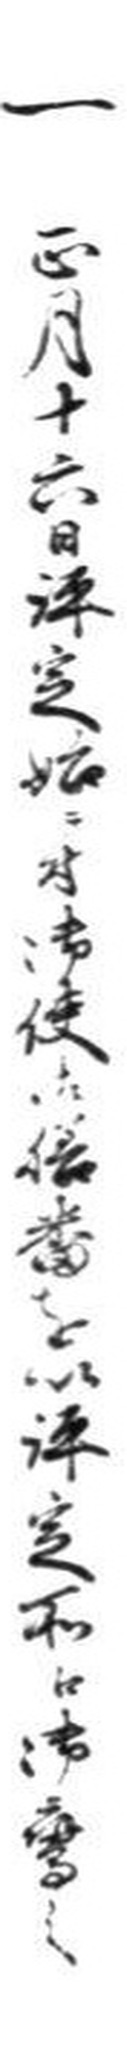一正月十六日評定始ニ付御使御膳番を以評定所江御鷹之
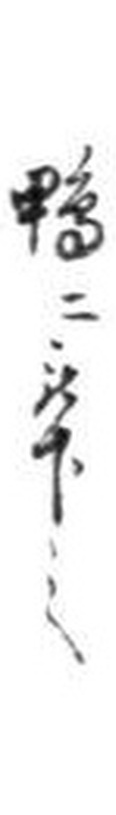鴨ニ被下之
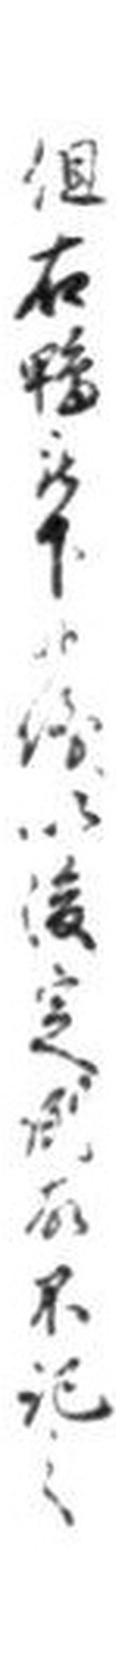但右鴨被下候儀以後定例故不記之
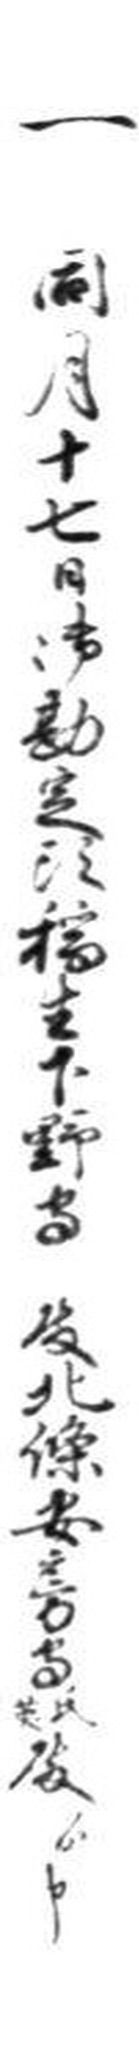一同月十七日御勘定頭稲生下野守殿北条安房守氏英殿ゟ申
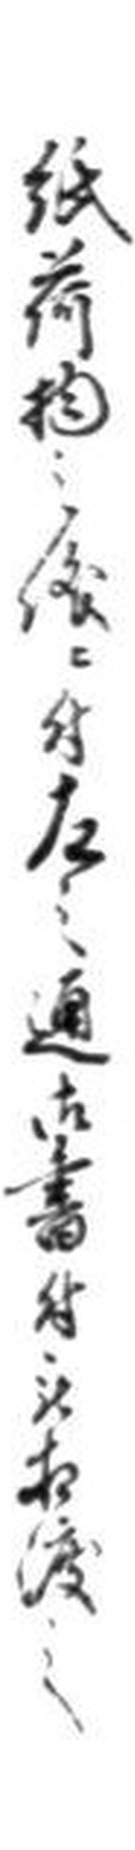紙荷物之儀ニ付左之通御書付被相渡之
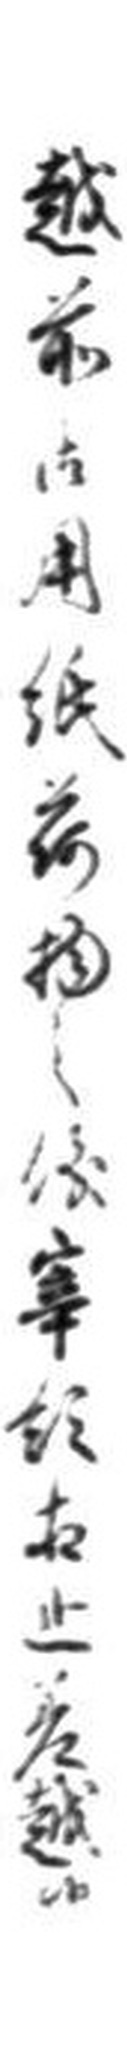越前御用紙荷物之儀宰領相止差越候
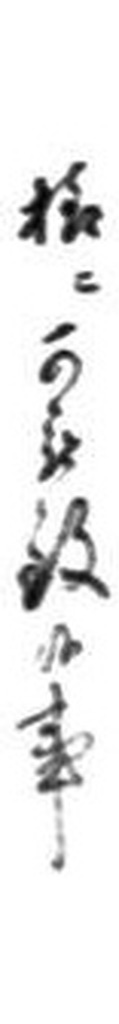様ニ可被致候事
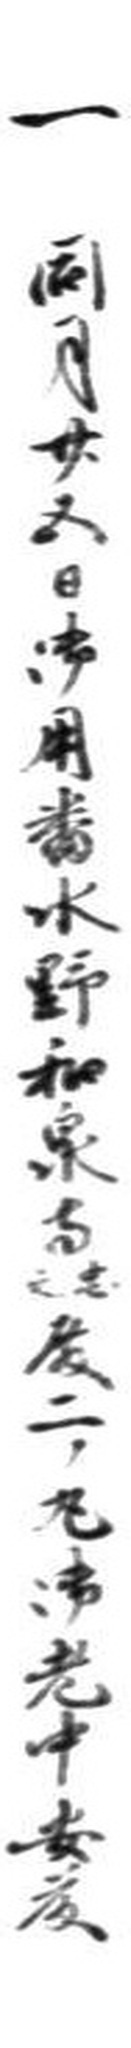一同月廿五日御用番水野和泉守忠之殿二ノ丸御老中安藤
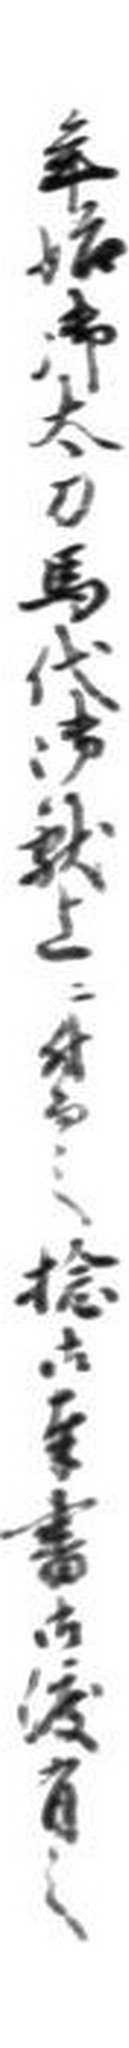年始御太刀馬代御献上ニ付而之捻御奉書御渡有之
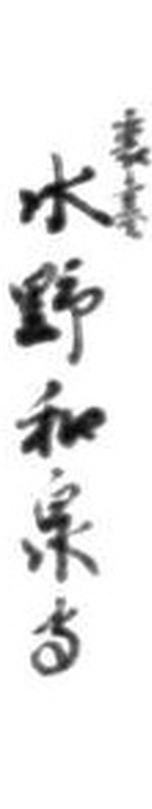水野和泉守
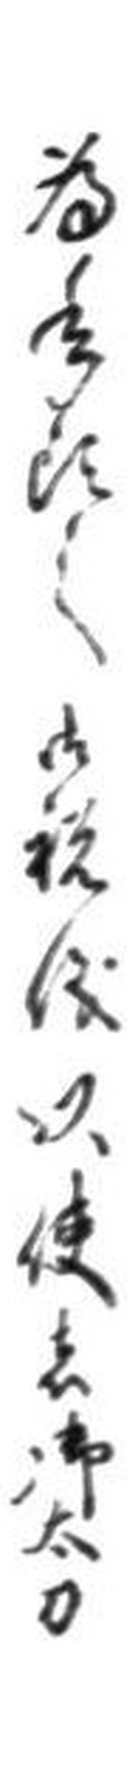為年頭之御祝儀以使者御太刀
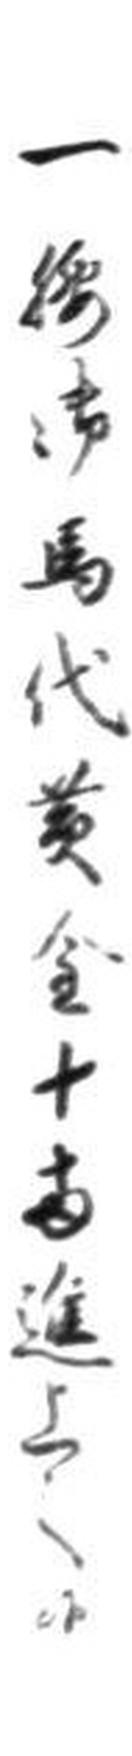一腰御馬代黄金十両進上之候

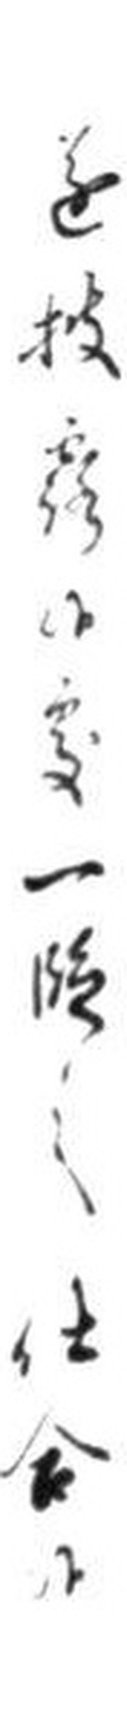遂披露候処一段之仕合候
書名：家譜 三十九 宗矩公 享保十年
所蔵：福井県文書館 Fukui Prefectural Archives
